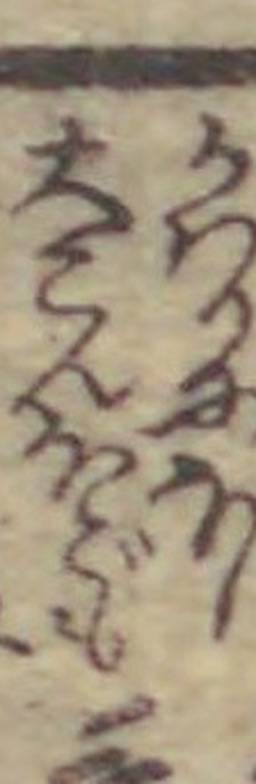大こんほども
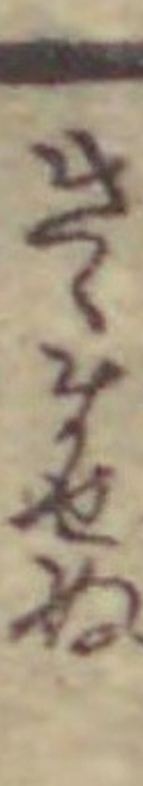きゝませぬ
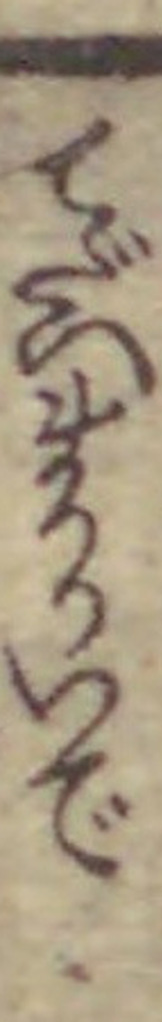てだいまかりいで
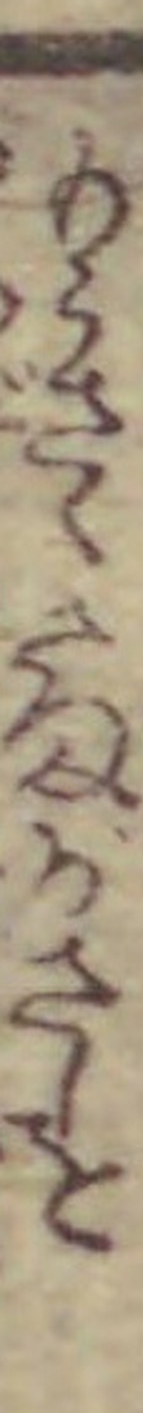もうさくさまかさしを
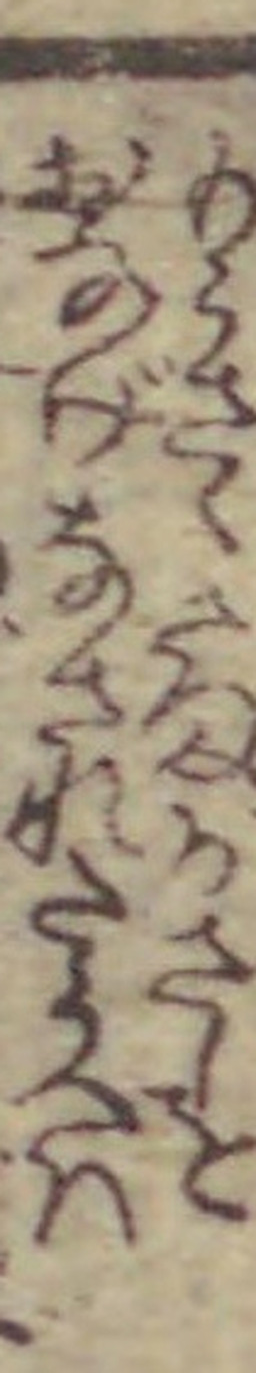おなげなされたうへは
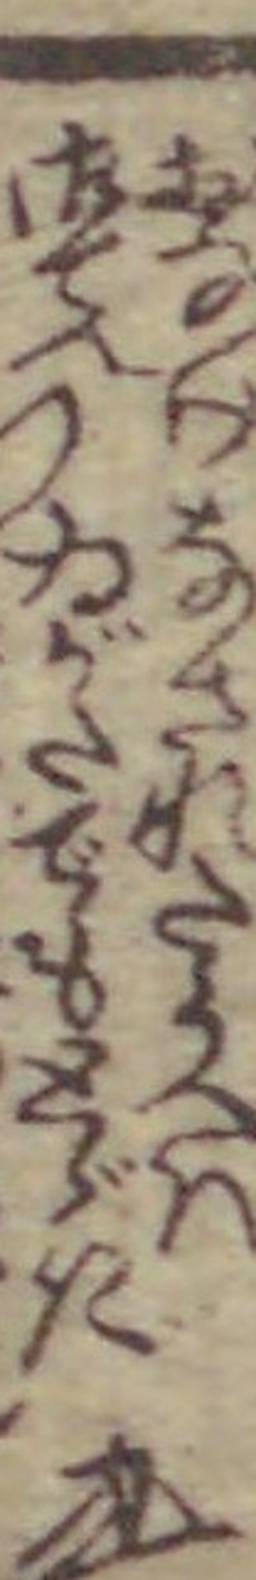御てんゐがたでもとゞき
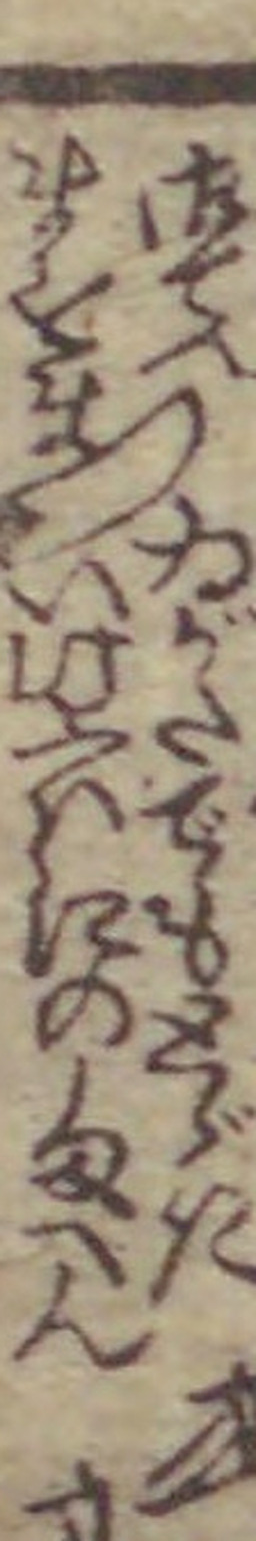ますまい此上は江のしまへん
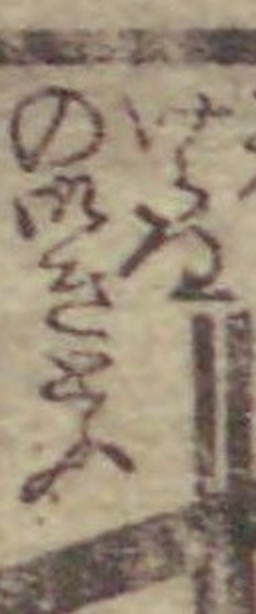の御きとふ
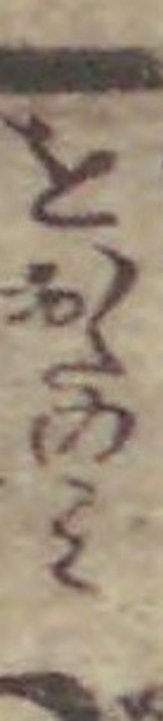をおたのみ
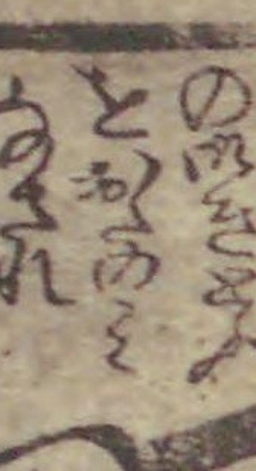をおたのみ
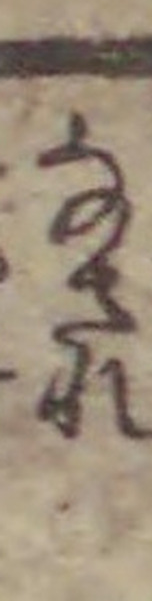なされ
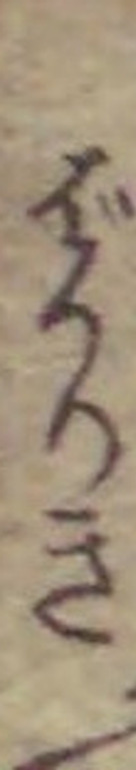ばかりき

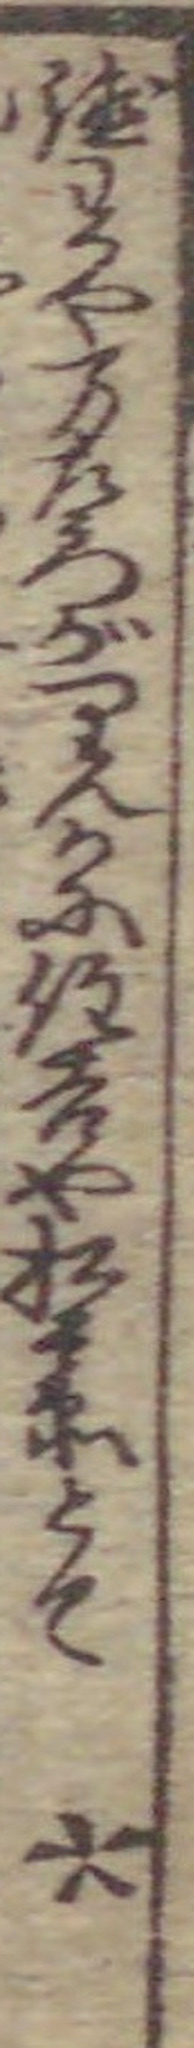徳わかや万左衛門がりんかに住吉や松兵衛とて
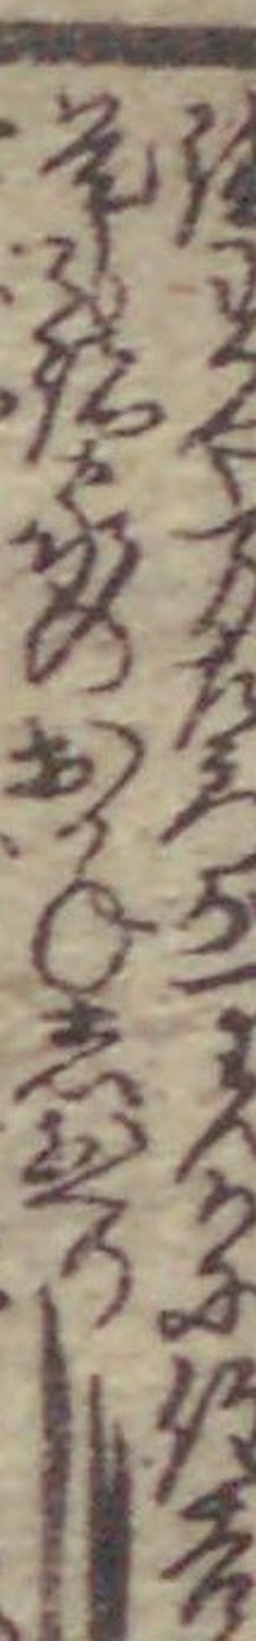是も諸家のおかねしおくり
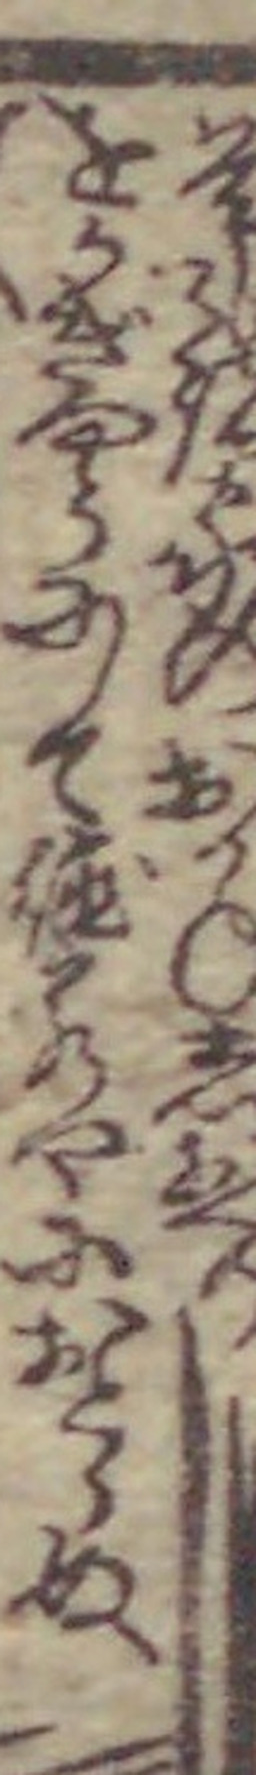をかぎやうにして徳若やにおとらぬ
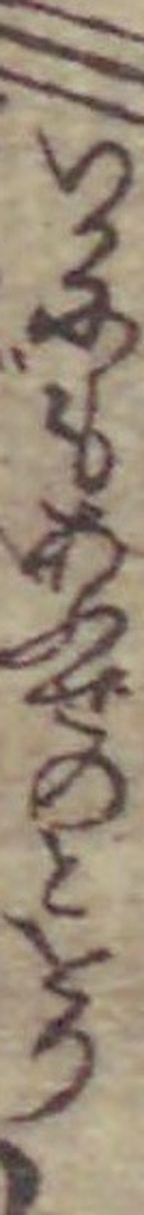いかにもあふせのとをり
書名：止而道致虚録 3巻
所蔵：国立国会図書館 National Diet Library, JAPAN
